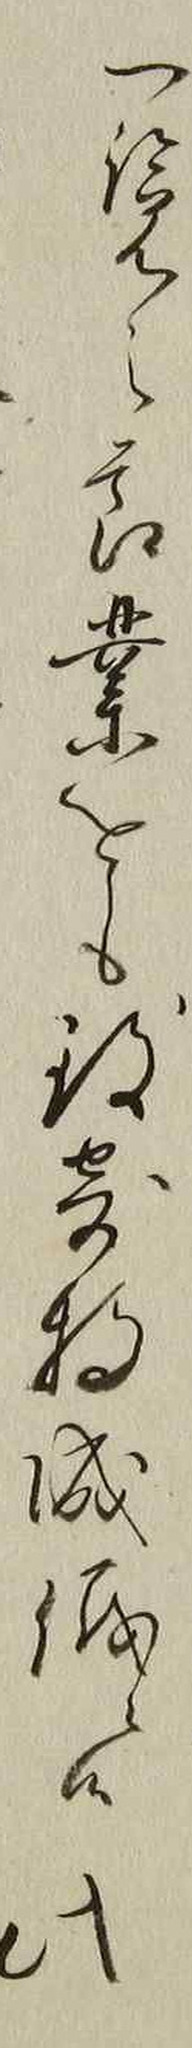一覧之節業をも致奇特成儀に候此
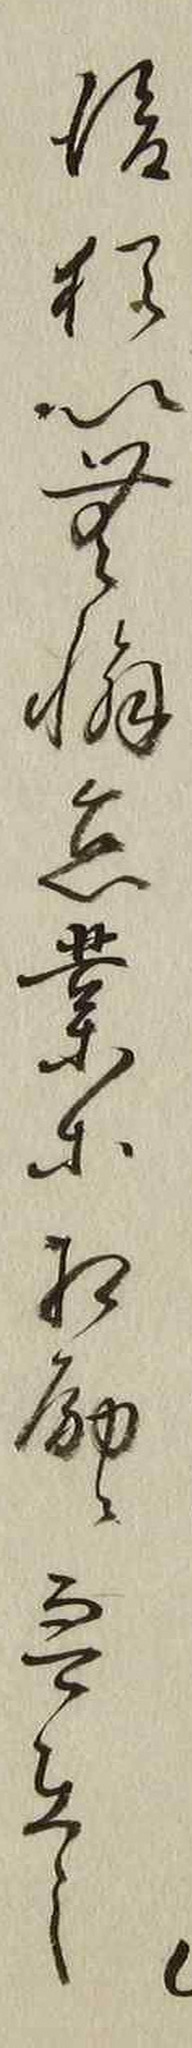後猶以無懈怠業等相励に而可在之
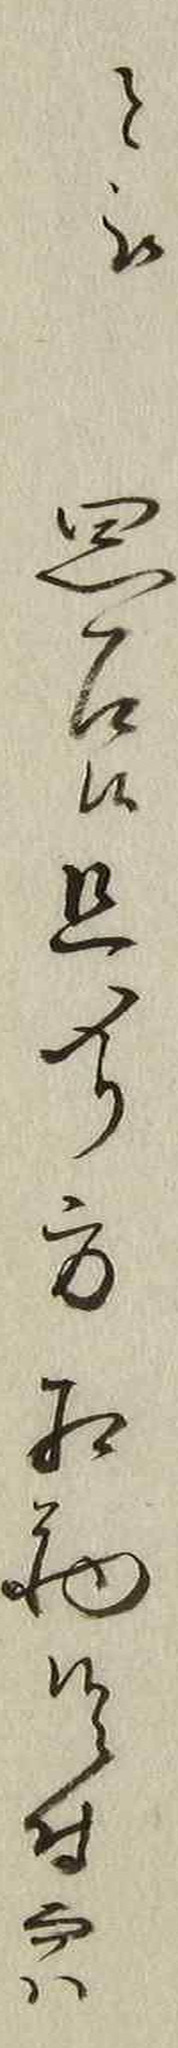と被思召候且〆り方相勤候に付而ハ
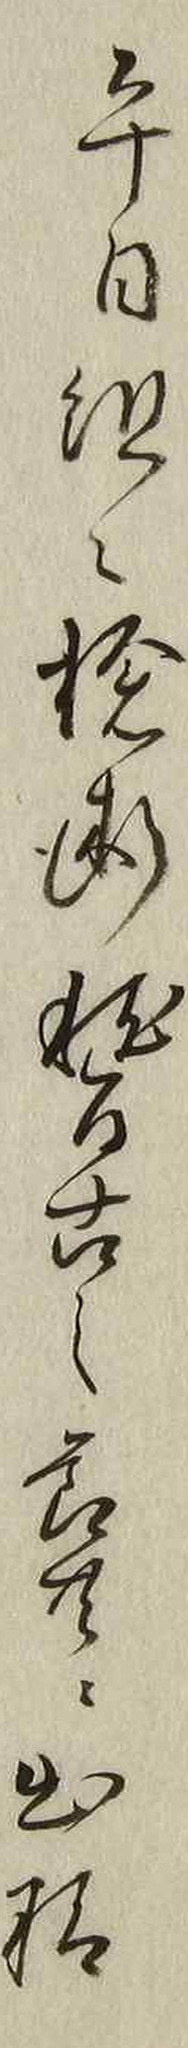平日組々槍術稽古之節共に出精
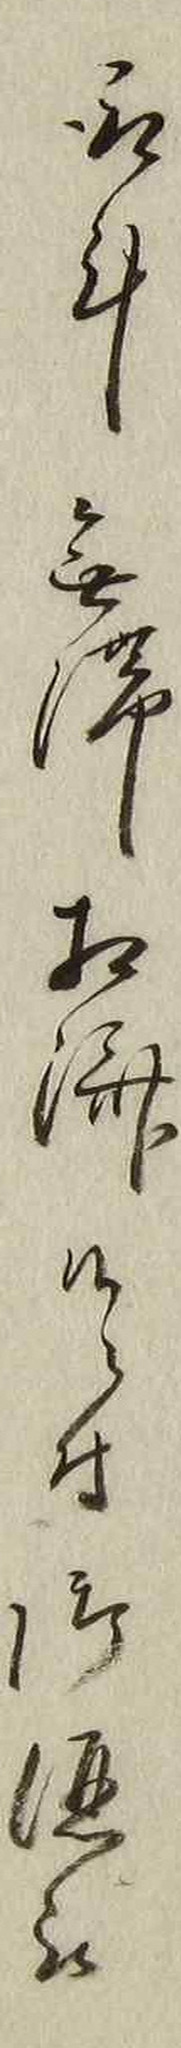取計無滞相済候に付御酒被
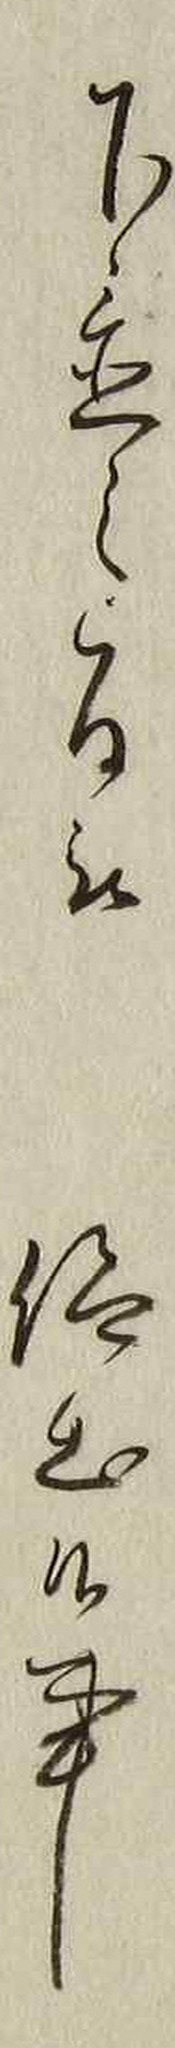下置之旨被仰出候事
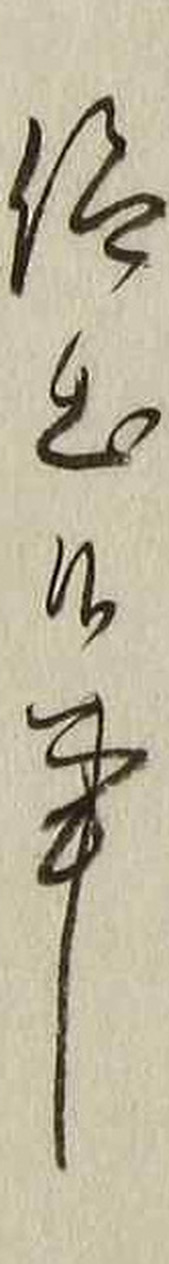仰出候事
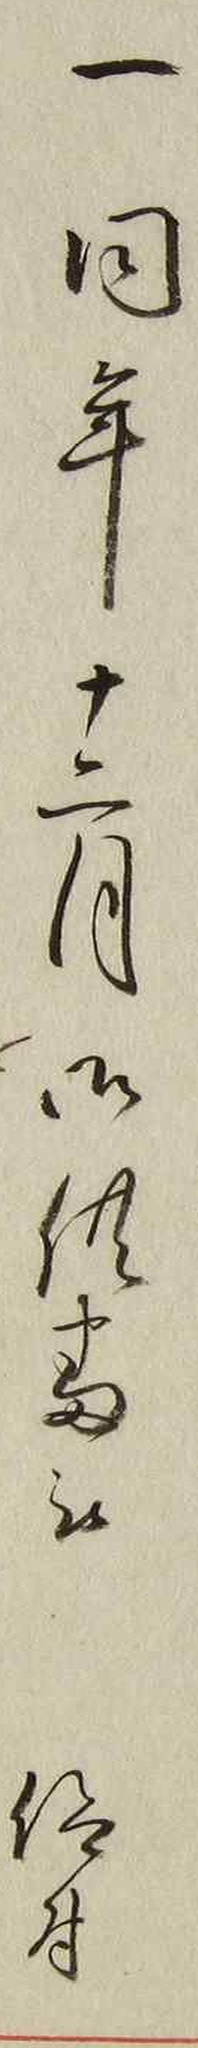一同年十二月御供番被仰付
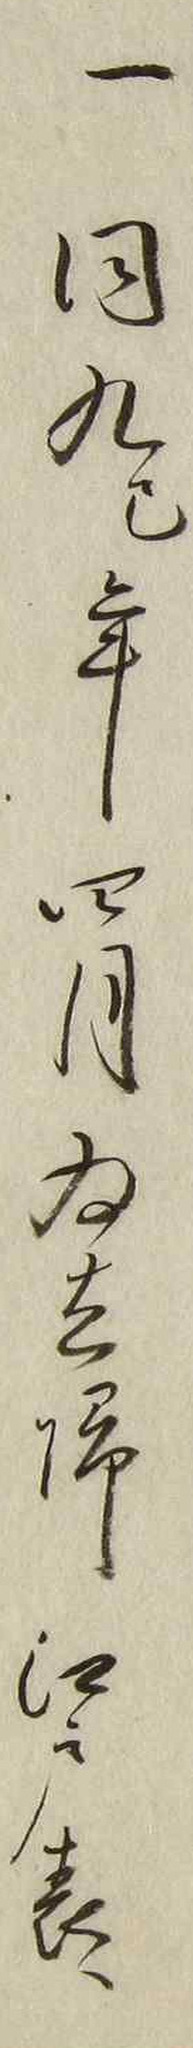一同九巳年四月為立帰江戸表江へ

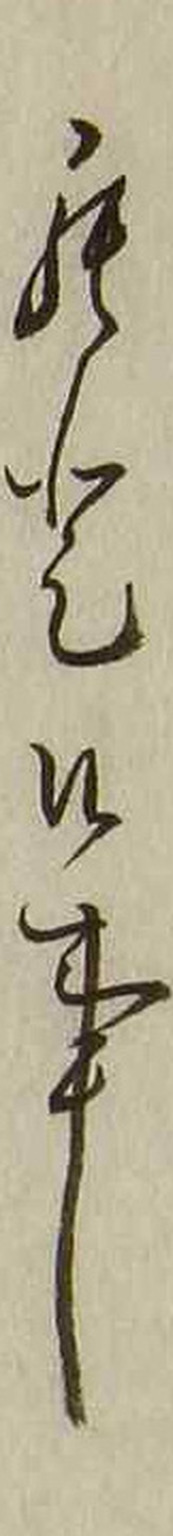罷登候事
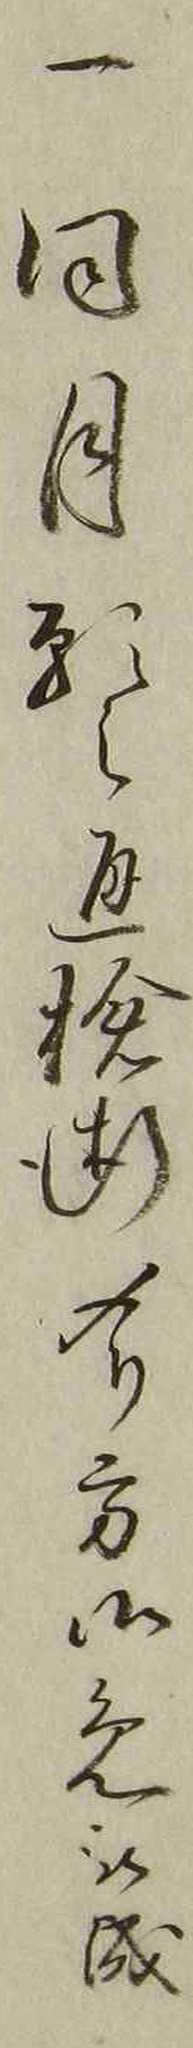一同月願之通槍術〆り方御免被成
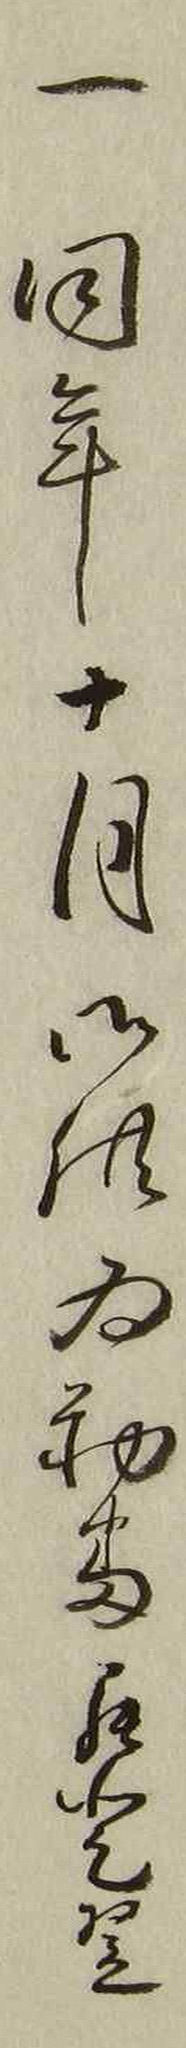一同年十月御供為勤番罷登翌
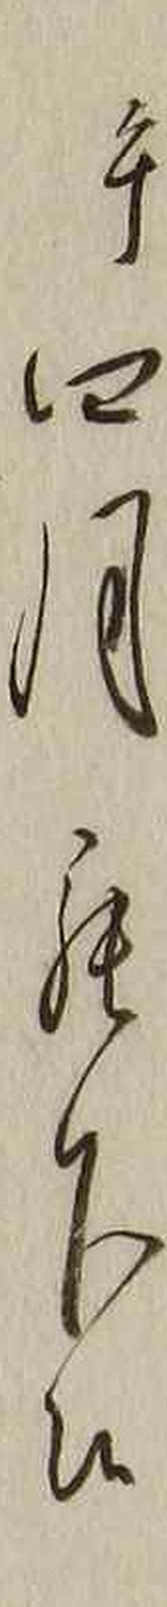午四月罷下候
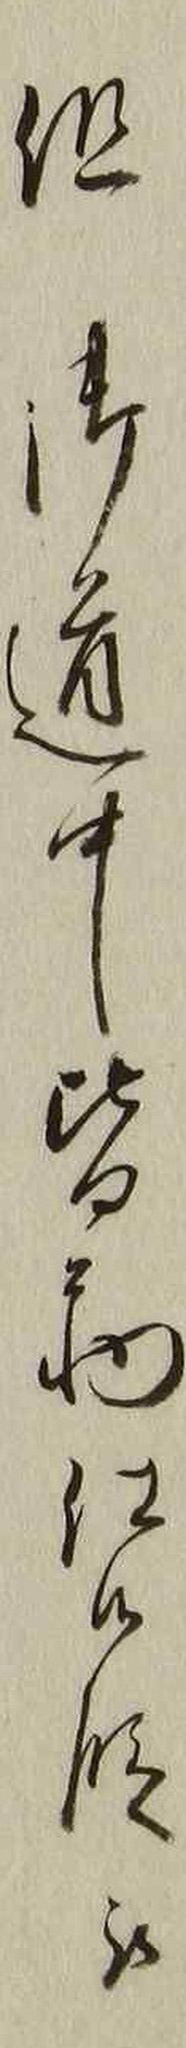但御道中皆勤仕候段被
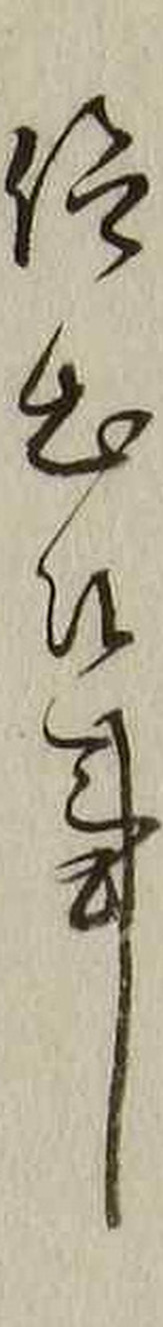仰出候事
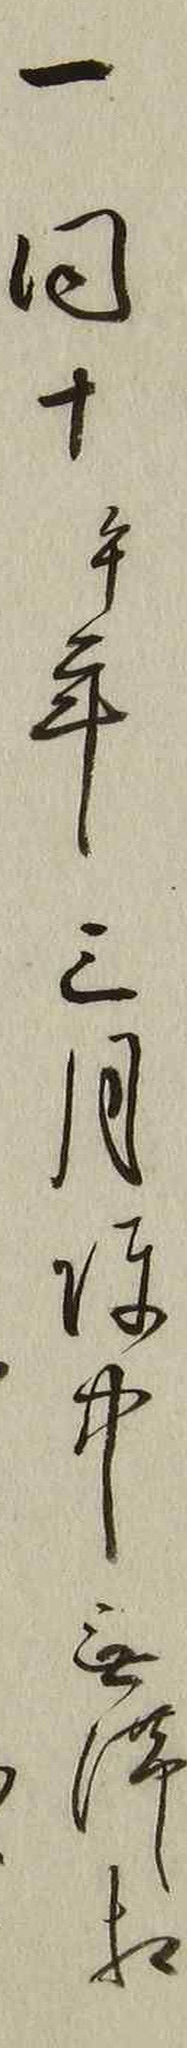一同十午年三月陣中無滞相
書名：諸士系譜　巻之6　い之部6
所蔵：会津若松市立会津図書館
